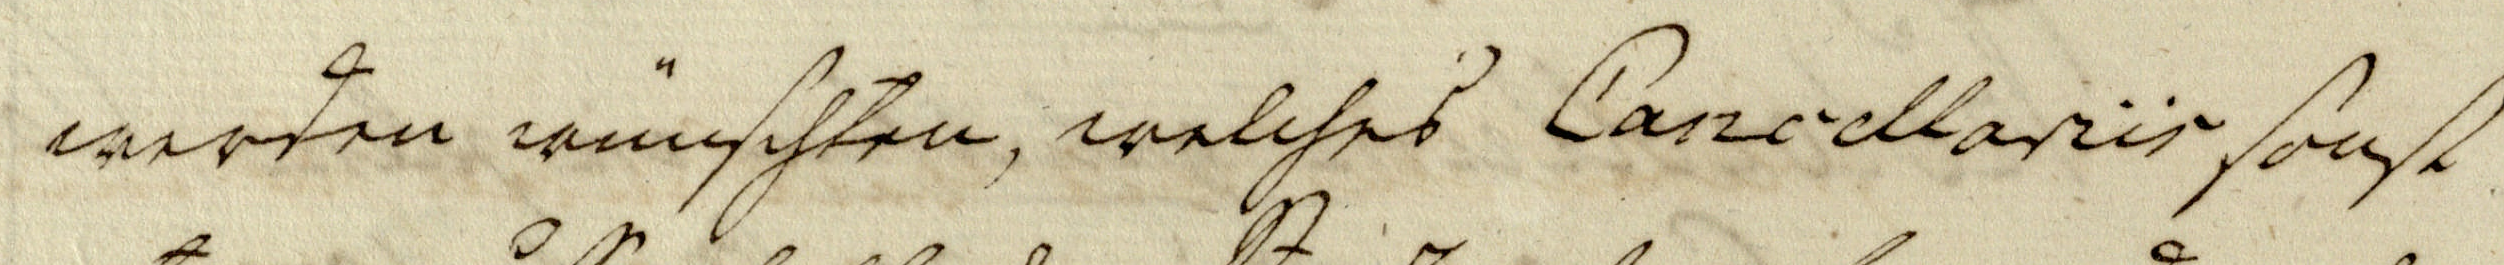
werden wünschten, welches Cancellariis sonst
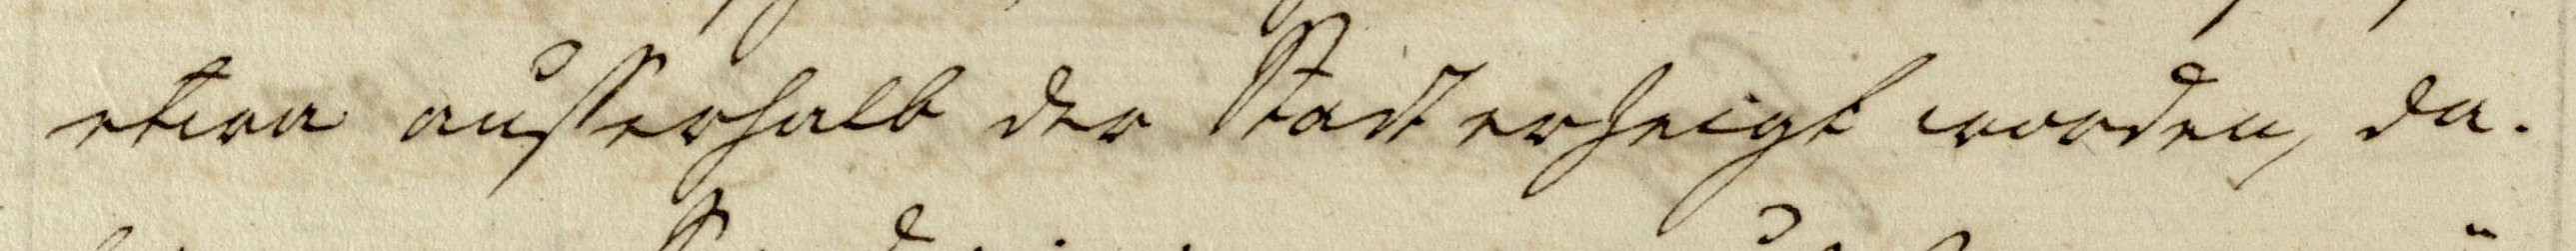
etwa ausserhalb der Stadt erzeigt worden, da¬
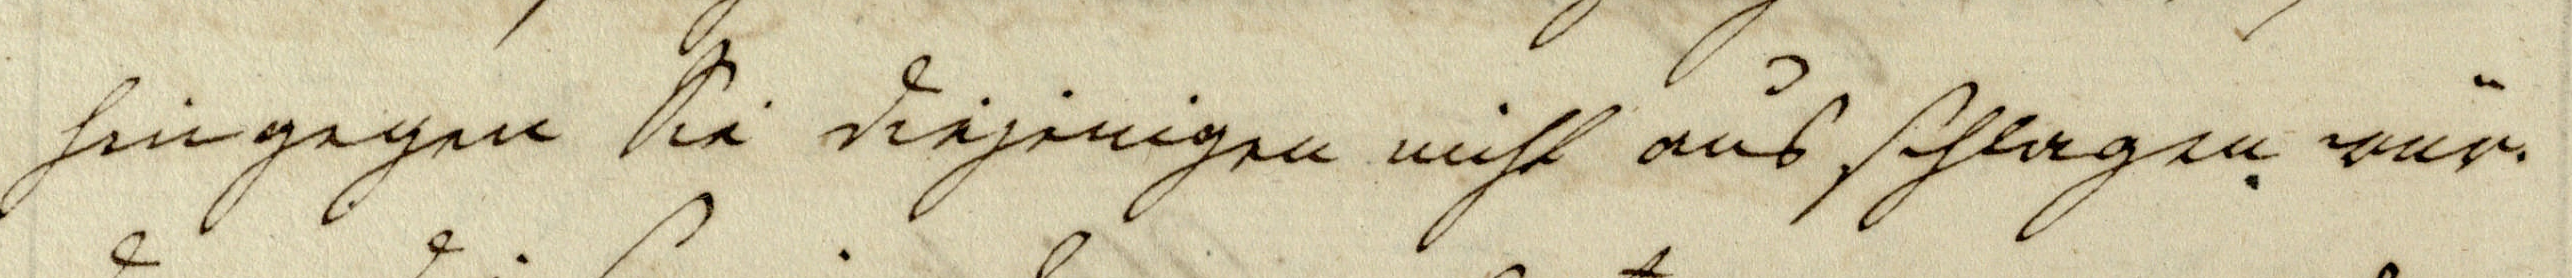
hingegen Sie diejenigen nicht aus schlagen wür¬
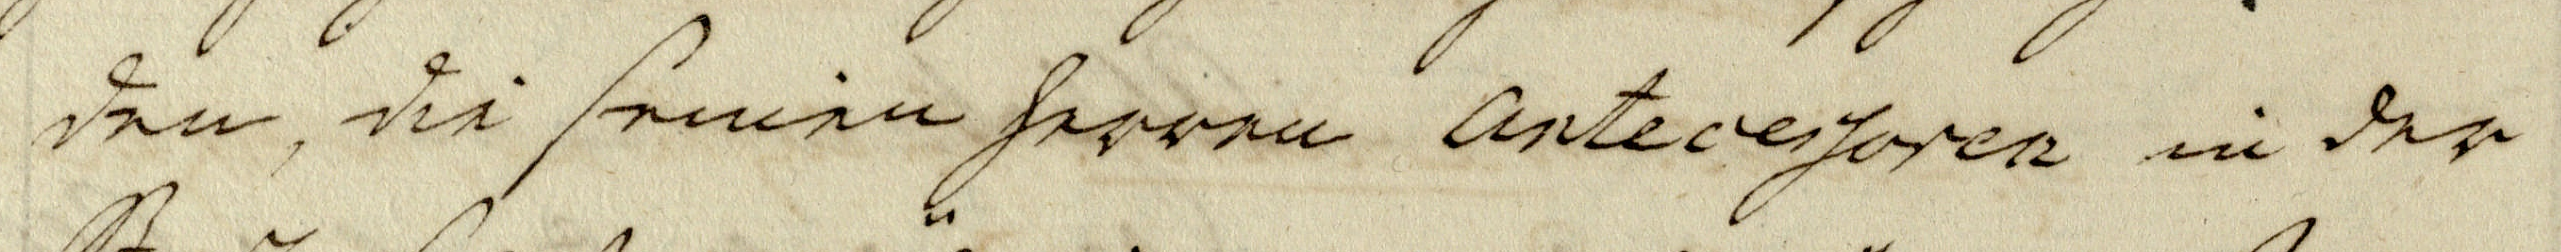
den, die seinen Herren Antecessoren in der
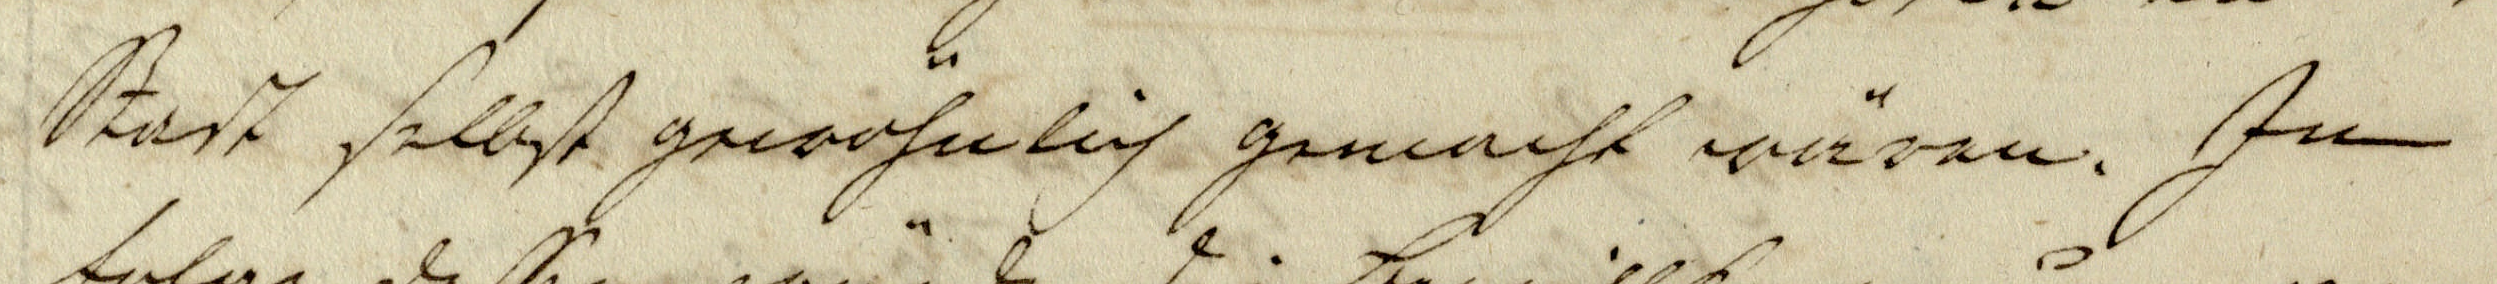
Stadt selbst gewöhnlich gemacht wären. In
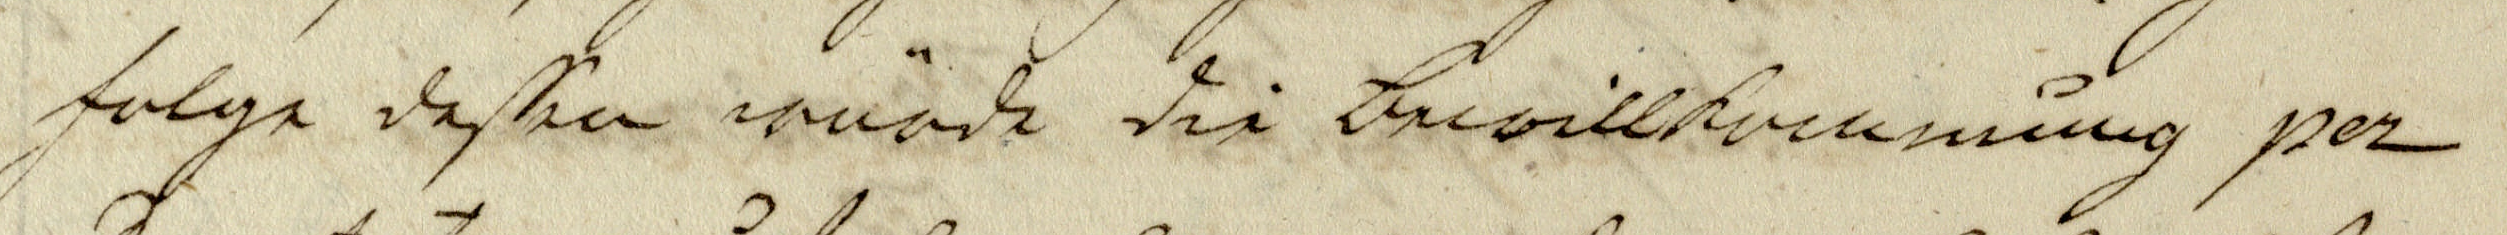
Folge dessen würde die Bewillkommung per
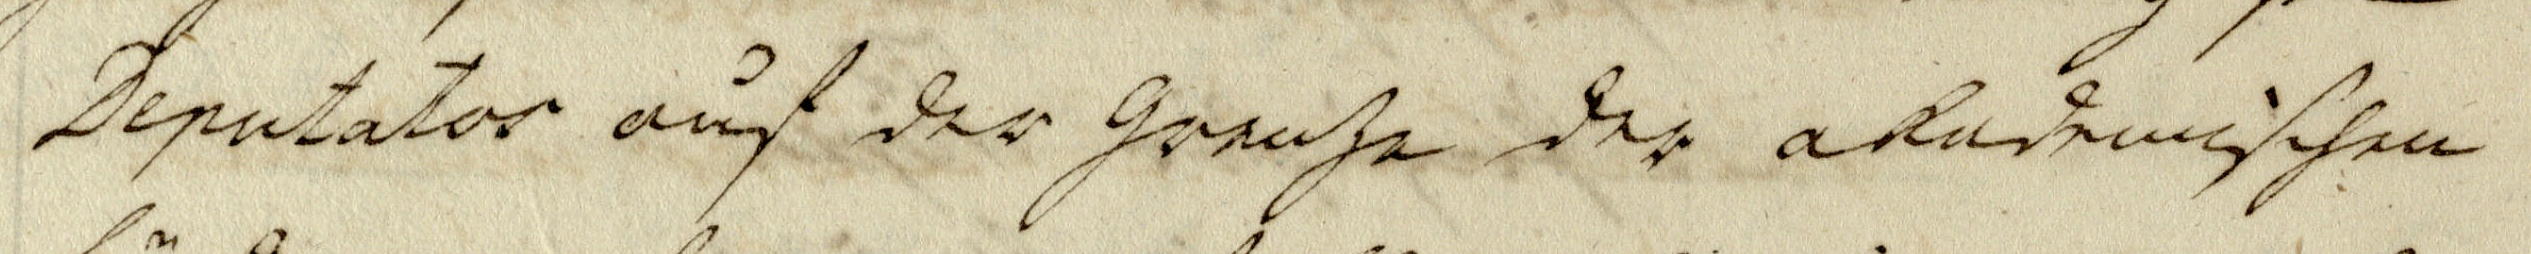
Deputatos auf der Grenze der akademischen
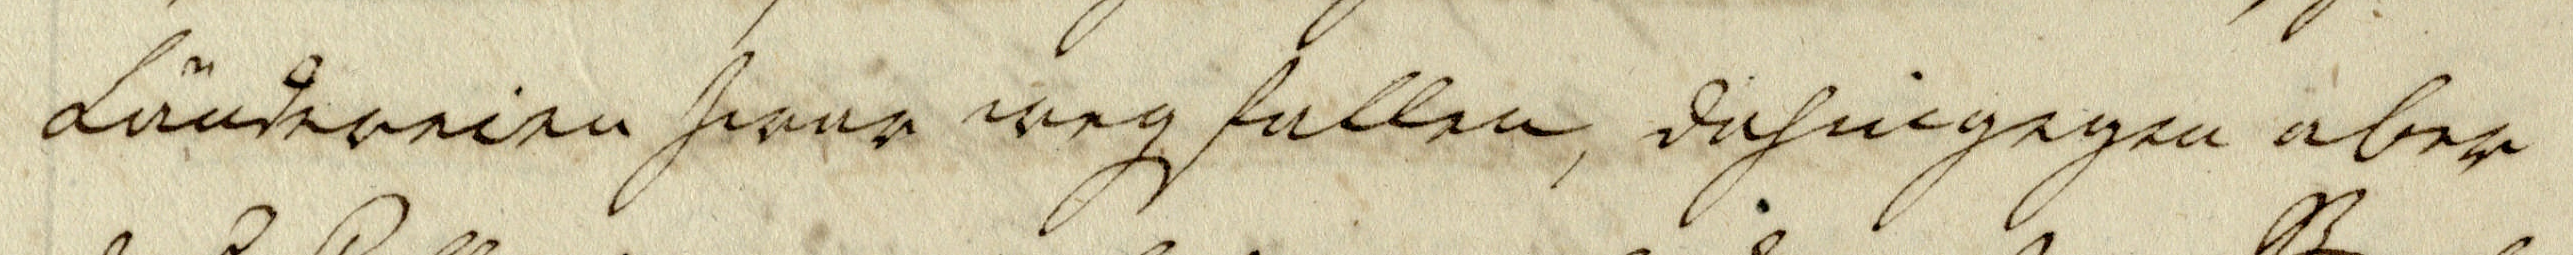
Ländereien zwar wegfallen, dahingegen aber
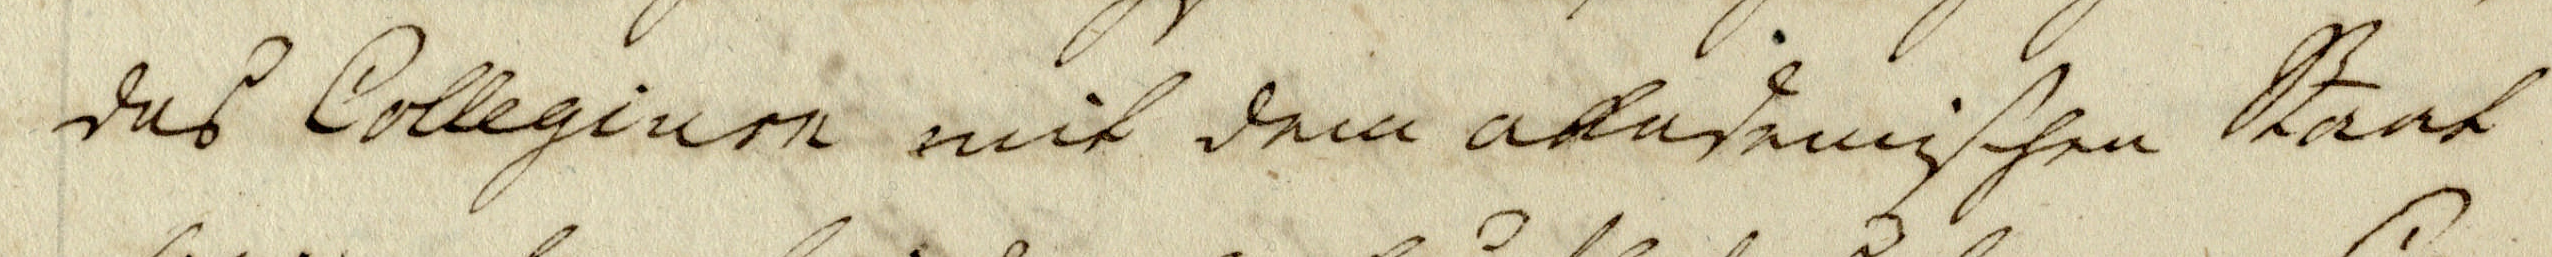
das Collegium mit dem akademischen Staat
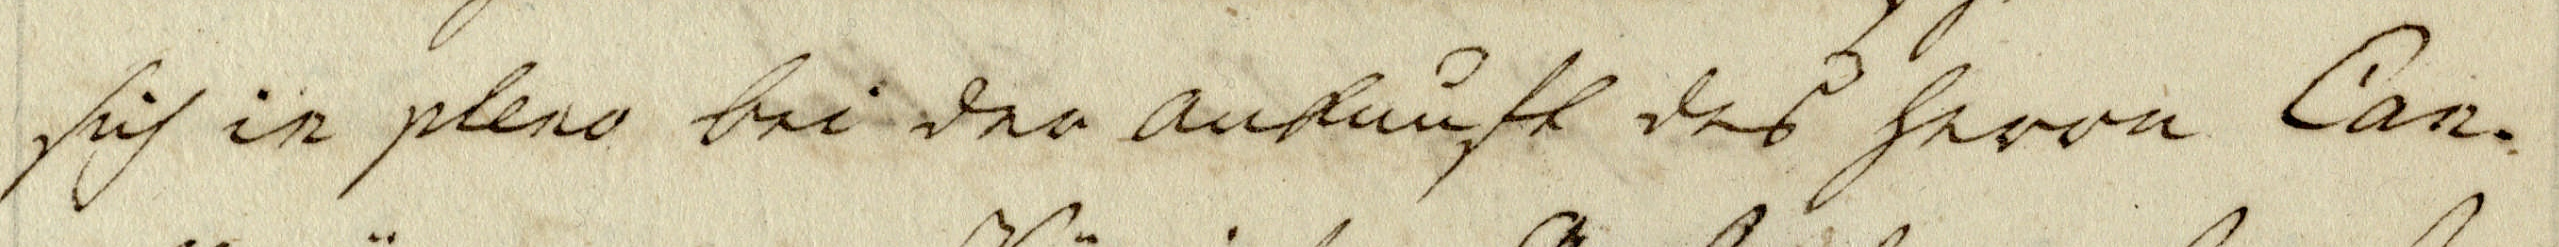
sich in pleno bei der Ankunft des Herrn Can¬
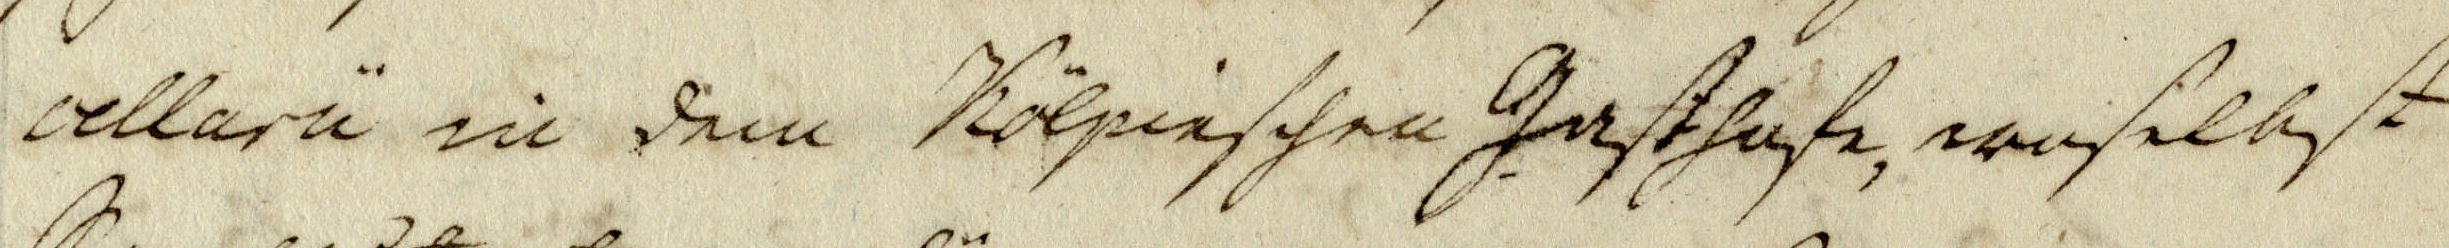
cellarii in dem Kölpinschen Gasthofe, woselbst
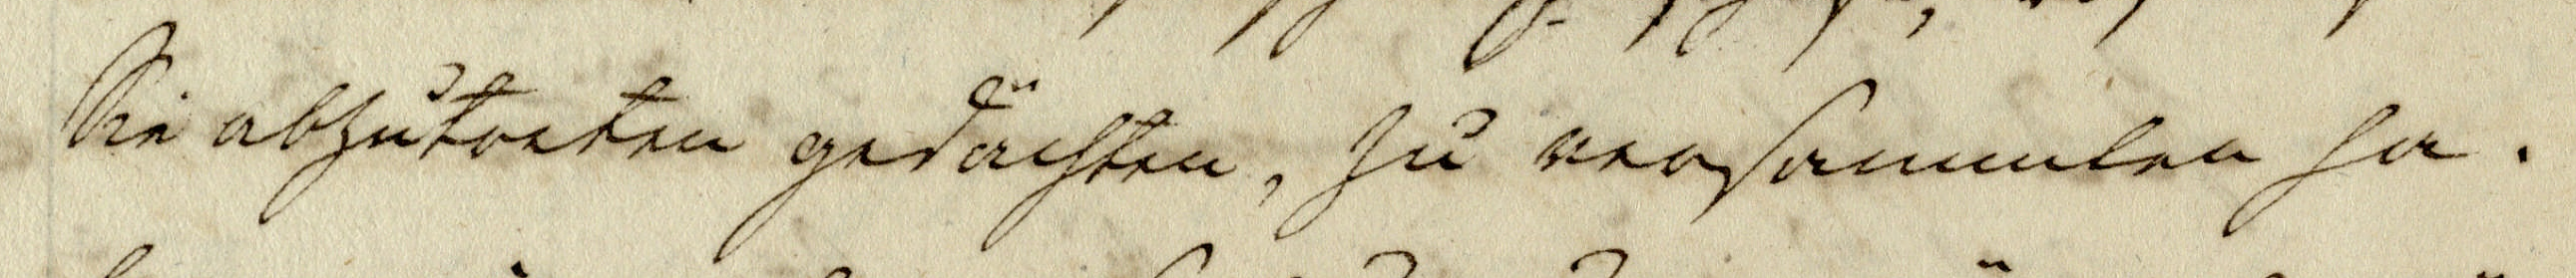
Sie abzutreten gedächten, zu versammlen ha¬
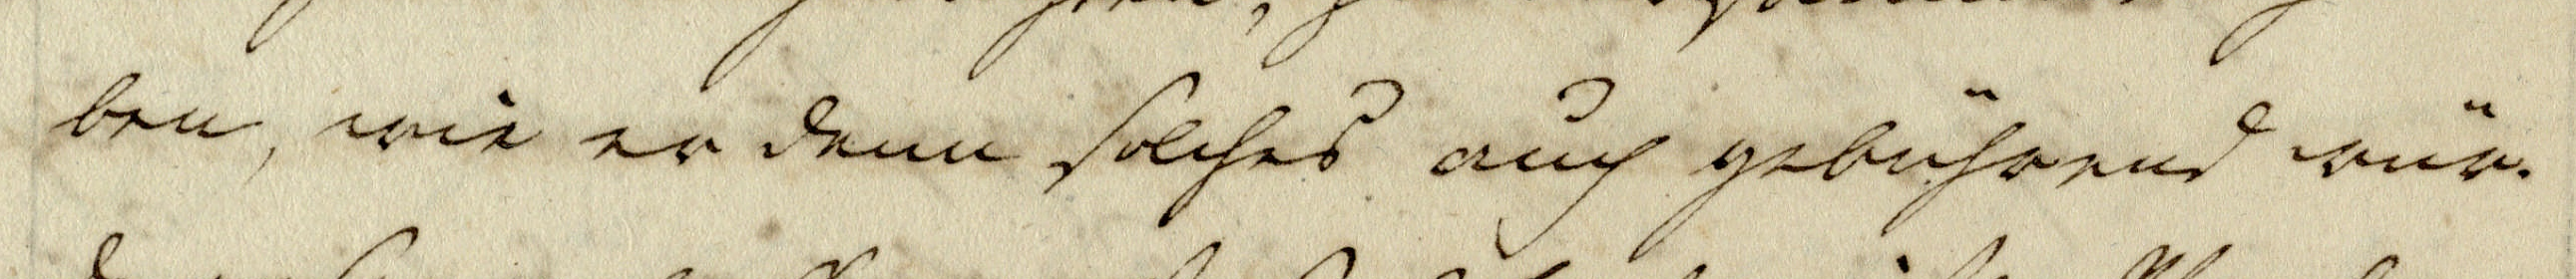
ben, wie er denn solches auch gebührend wür¬
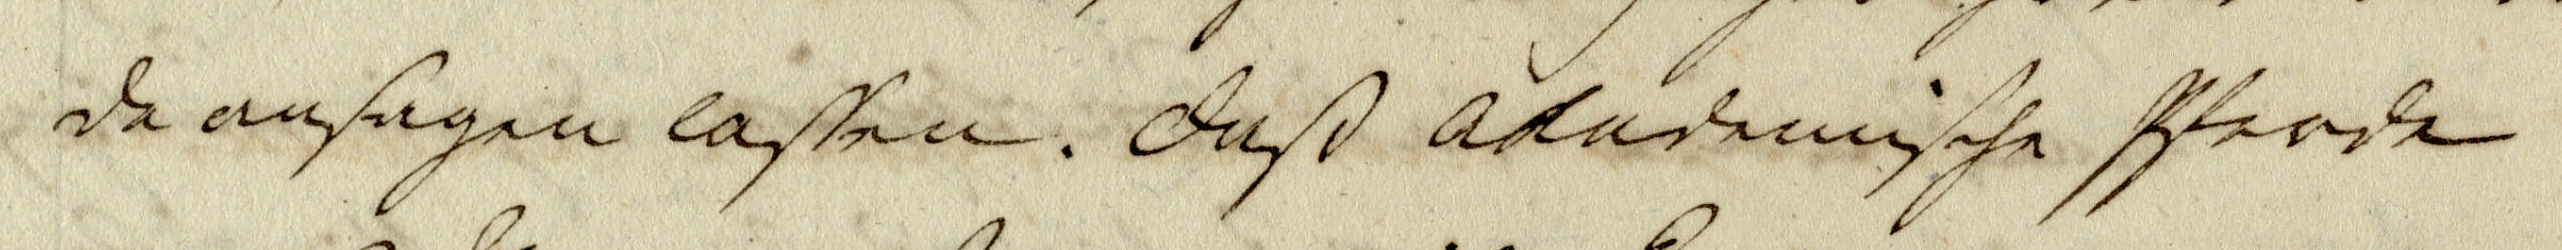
da ansagen lassen. Daß Akademische Pferde
